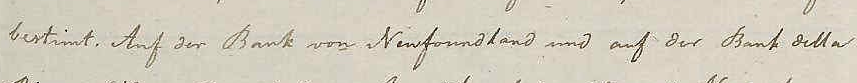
bestimt. Auf der Bank von Newfoundland und auf der Bank della
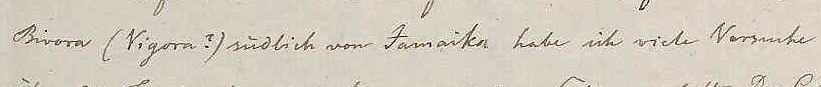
Bivora südlich von Jamaika habe ich viele Versuche
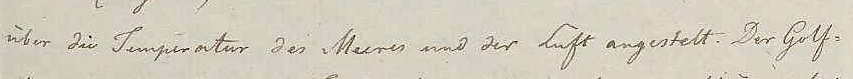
über die Temperatur des Meeres und der Luft angestelt. Der Golf-
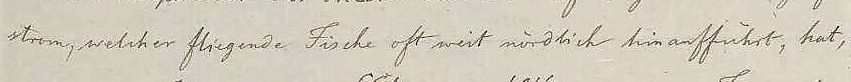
strom, welcher fliegende Fische oft weit nördlich hinaufführt, hat,
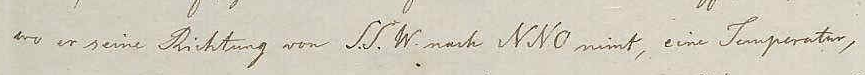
wo er seine Richtung von S.S.W. nach NNO nimt, eine Temperatur,
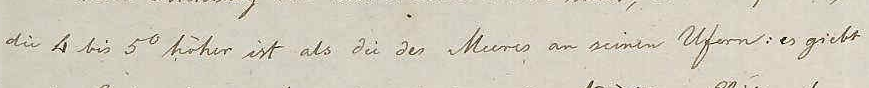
die 4 bis 5° höher ist als die des Meeres an seinen Ufern: es giebt
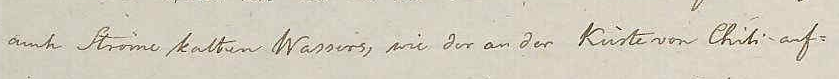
auch Ströme kalten Wassers, wie der an der Küste von Chili auf-
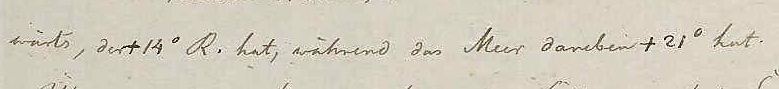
wärts, der +14° R. hat, während das Meer daneben +21° hat.
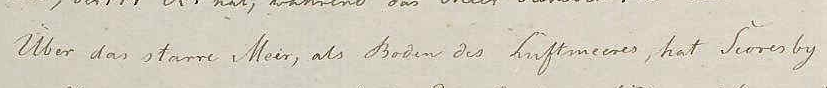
Über das starre Meer, als Boden des Luftmeeres, hat Scoresby
